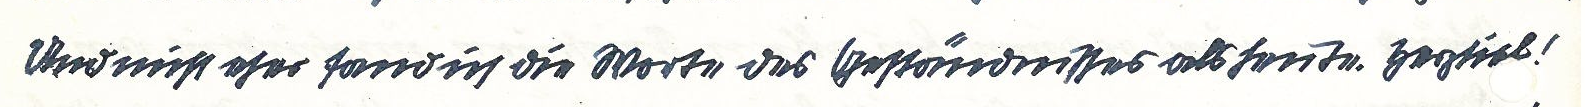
Und nicht eher fand ich die Worte des Geständnisses als heute. Herzlieb!
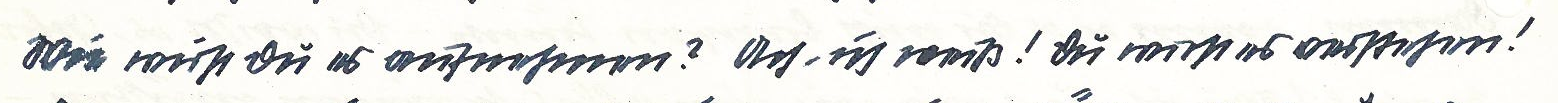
Wie wirst Du es aufnehmen? Ach, ich weiß! Du wirst es verstehen!
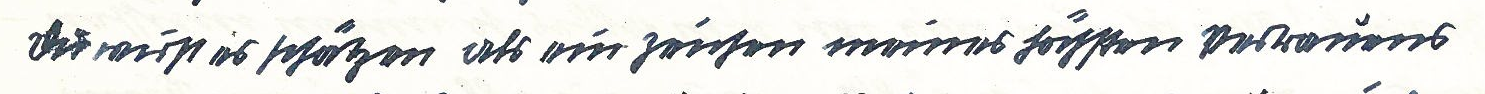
Du wirst es schätzen als ein Zeichen meines höchsten Vertrauens
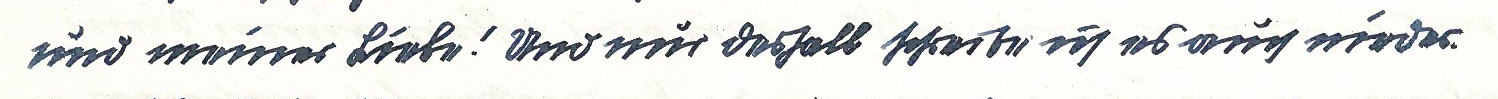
und meiner Liebe! Und nur deshalb schreibe ich es auch nieder.
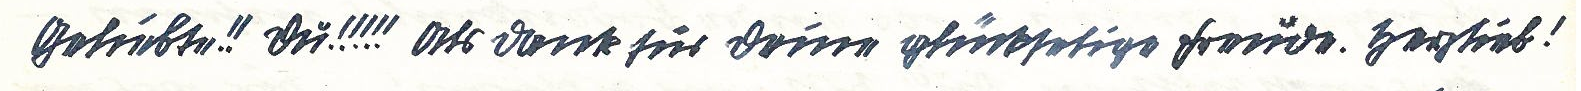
Geliebte!! Du!!!!! Als Dank für Deine glückselige Freude. Herzlieb!
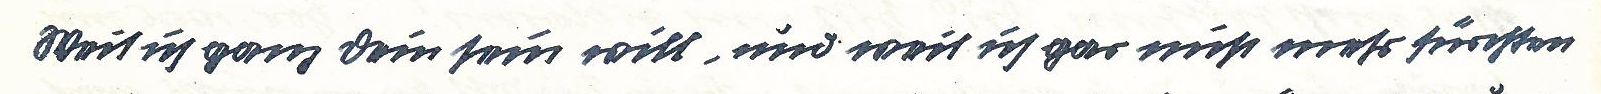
Weil ich ganz Dein sein will, und weil ich gar nicht mehr fürchten
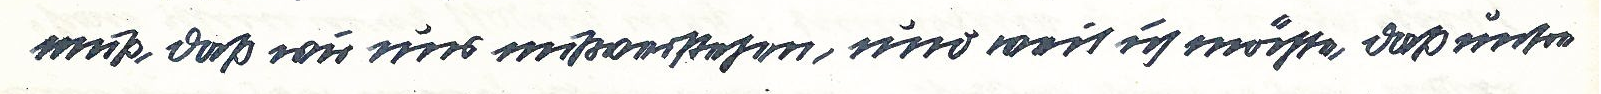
muß, daß wir uns mißverstehen, und weil ich möchte, daß unsre
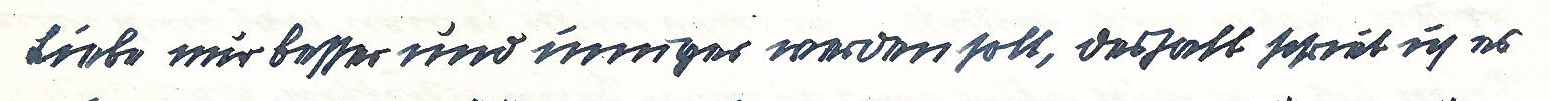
Liebe nur besser und inniger werden soll, deshalb schreib ich es
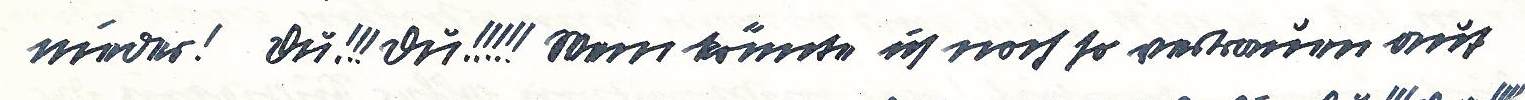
nieder! Du!!! Du!!!!! Wem könnte ich noch so vertrauen auf
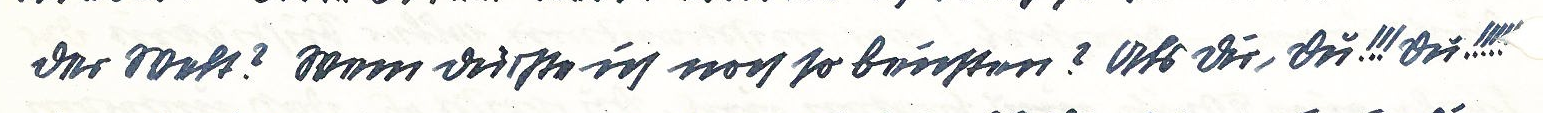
der Welt? Wem dürfte ich noch so beichten? Als Dir, Du!!! Du!!!!!
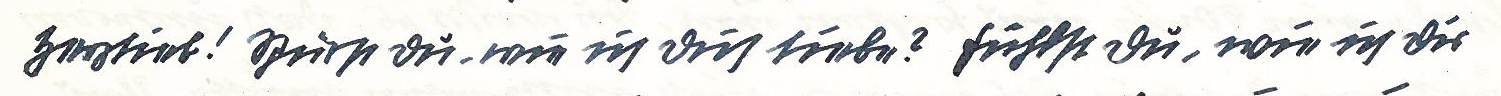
Herzlieb! Spürst Du, wie ich Dich liebe? Fühlst Du, wie ich Dir
